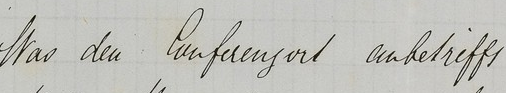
Was den Conferenzort anbetrifft
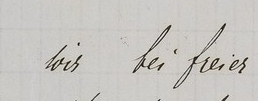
wir bei freier
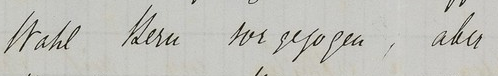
Wahl Bern vorgezogen, aber
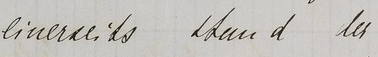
einerseits stand der
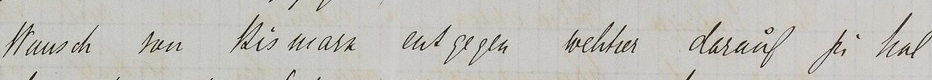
Wunsch von Bismark entgegen welcher darauf zu hal-
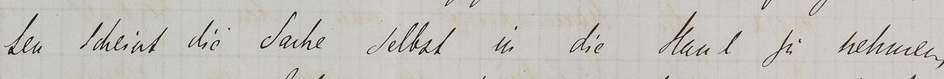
ten scheint die Sache selbst in die Hand zu nehmen,
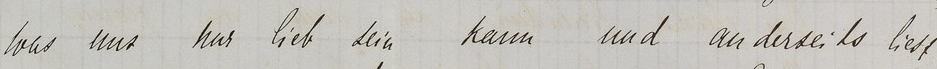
was uns nur lieb sein kann und anderseits liess
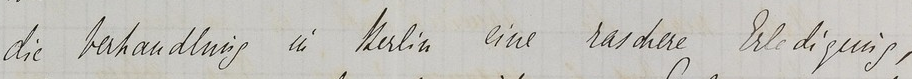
die Verhandlung in Berlin eine raschere Erledigung,
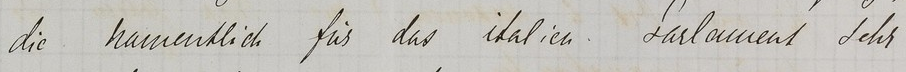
die namentlich für das italien. Parlament sehr
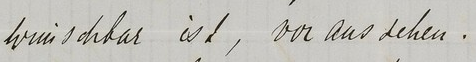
wünschbar ist, voraussehen.
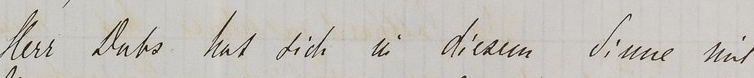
Herr Dubs hat sich in diesem Sinne mit
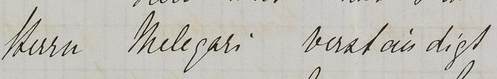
Herrn Melegari verständigt
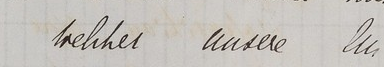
welcher unsere An-
